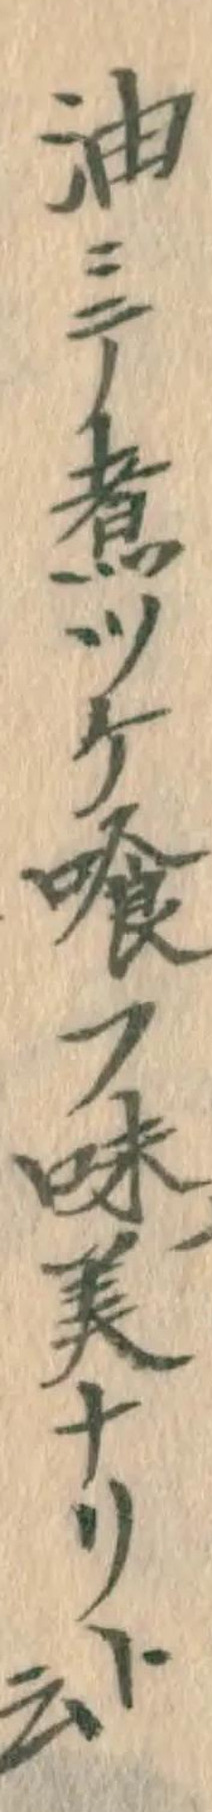油ニテ煮ツケ喰フ味美ナリト云
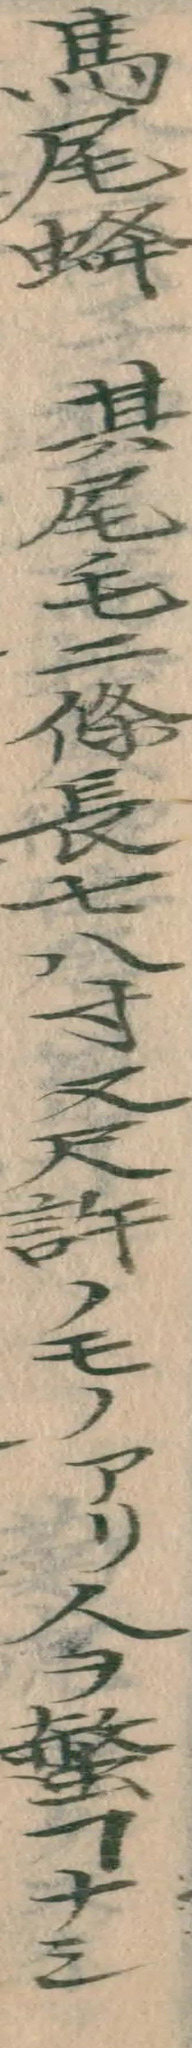馬尾蜂其尾毛二條長七八寸又尺許ノモノアリ人ヲ螫コトナシ
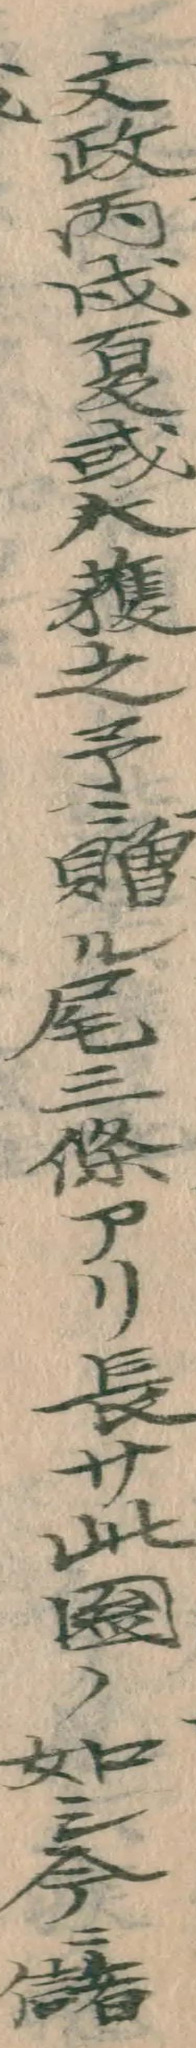文政丙戌夏或人獲之予ニ贈ル尾三條アリ長サ此圖ノ如シ今ニ儲

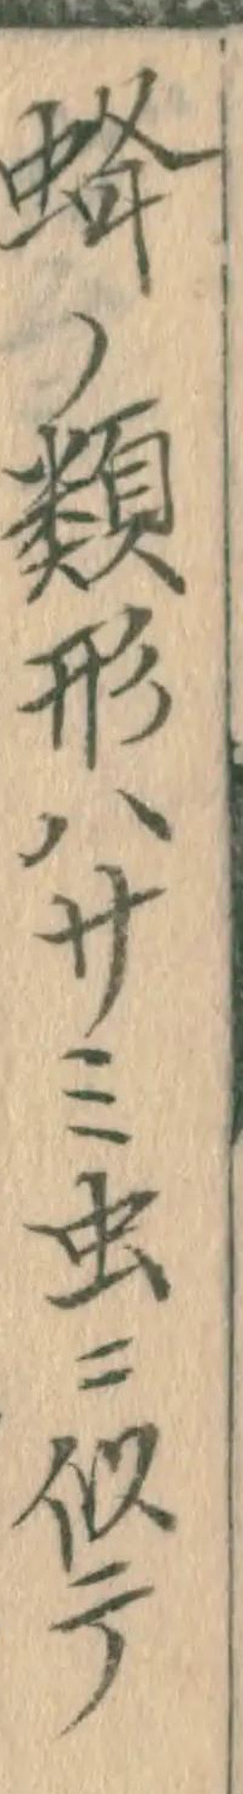蜂ノ類形ハサミ虫ニ似テ
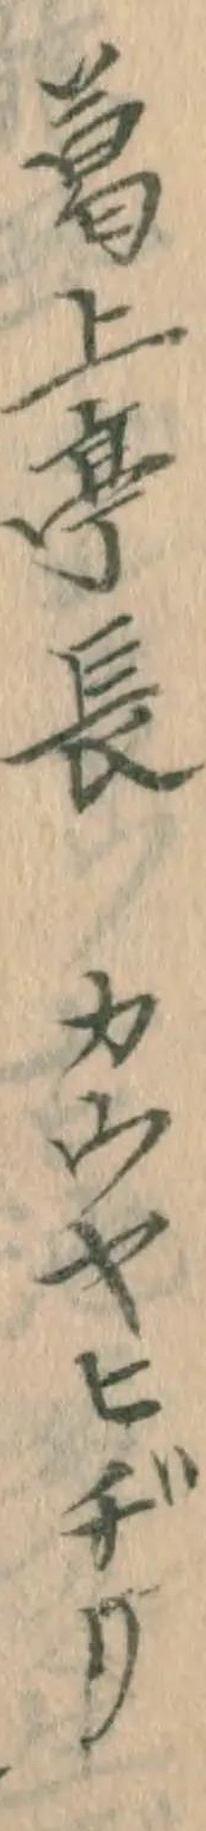葛上亭長カウヤヒヂリ
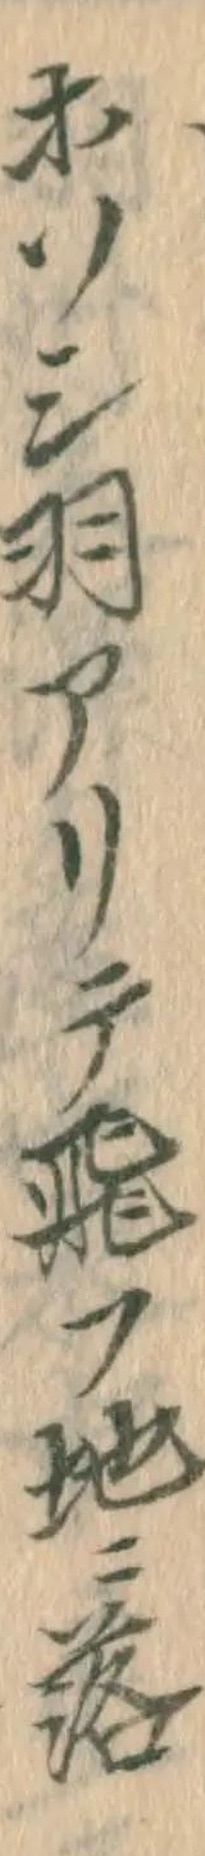ホソシ羽アリテ飛フ地ニ落
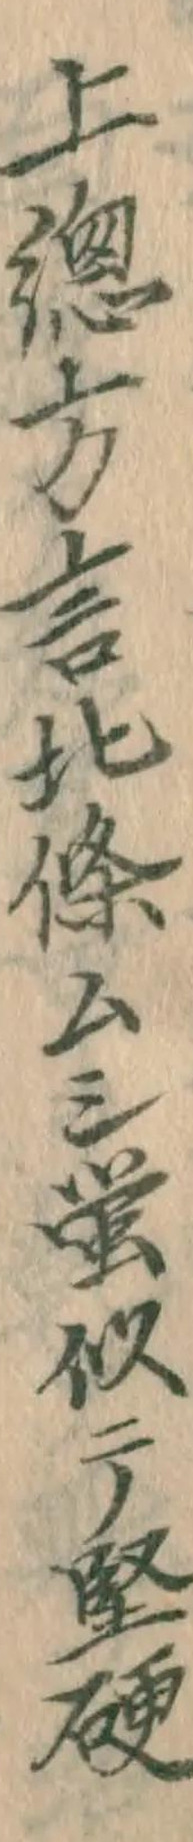上總方言北條ムシ蛍似テ堅硬
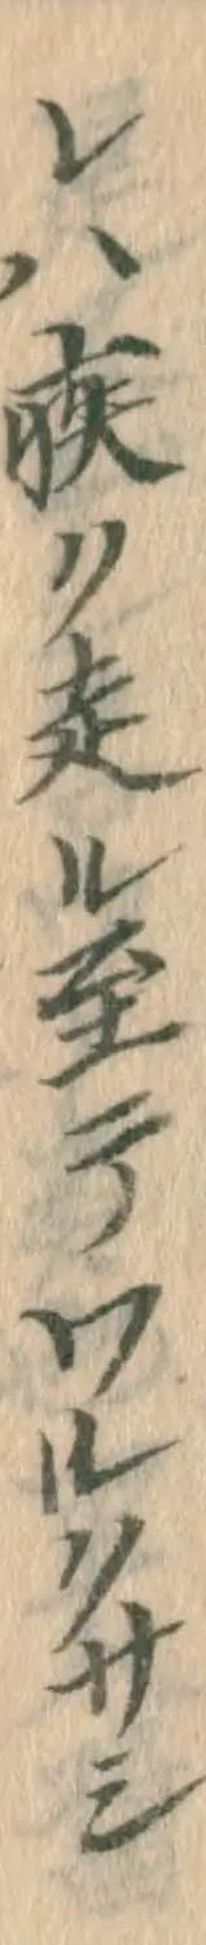レハ疾ク走ル至テワルクサシ
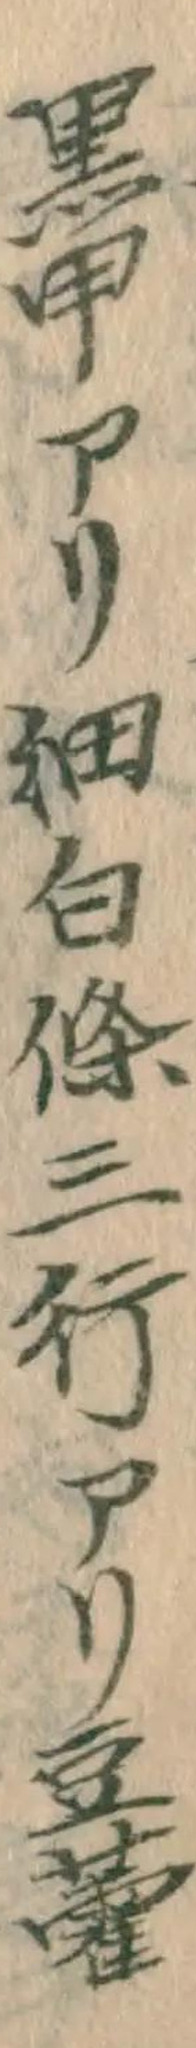黒甲アリ細白條三行アリ豆藿
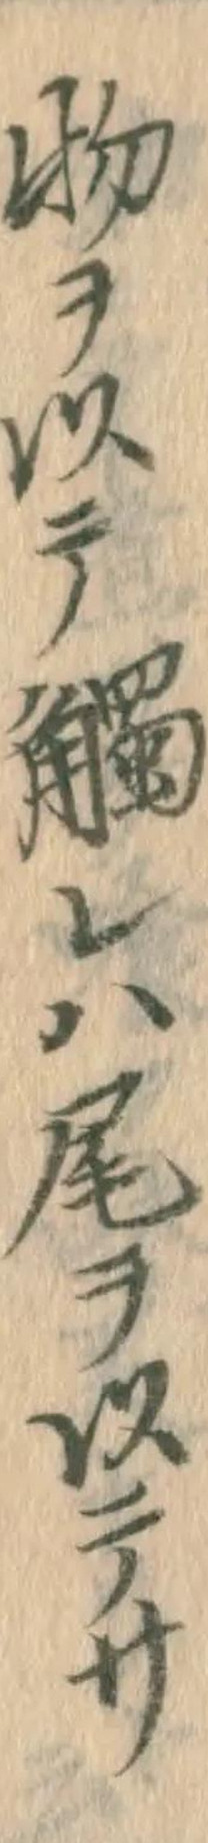物ヲ以テ觸レハ尾ヲ以テサ
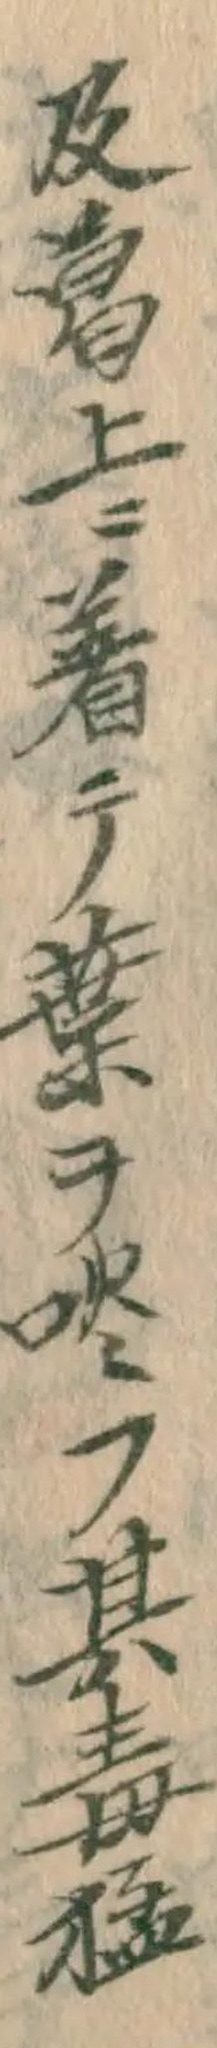及葛上ニ着テ葉ヲ啖フ其毒猛
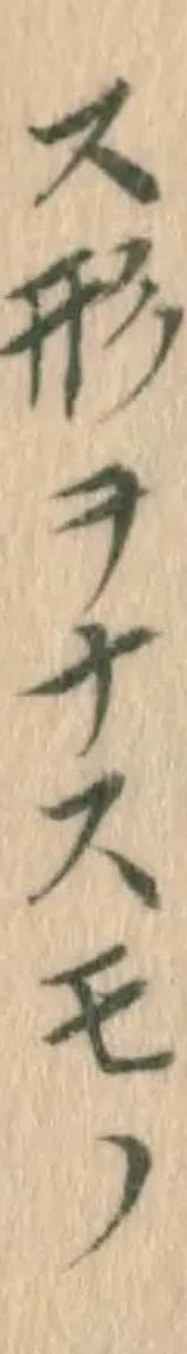ス形ヲナスモノ
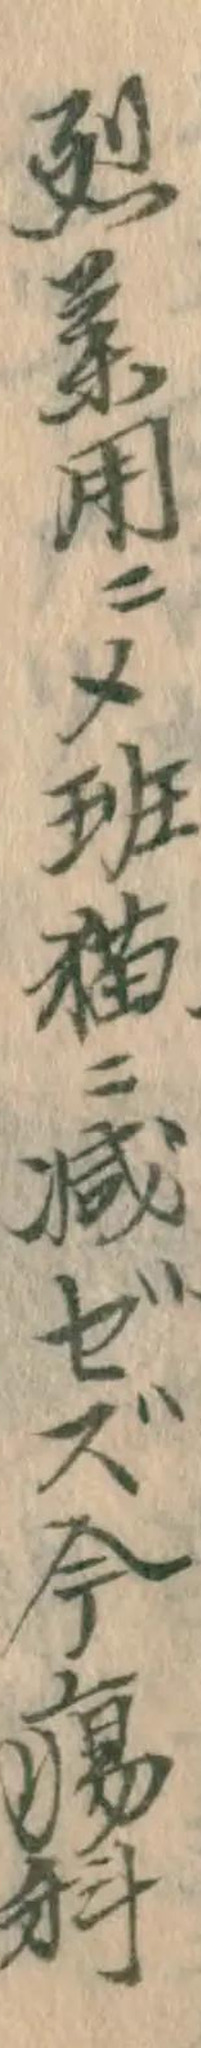烈薬用ニシテ班猫ニ减ゼズ今瘍科
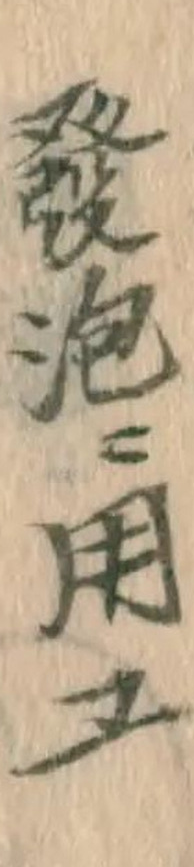發泡ニ用ユ
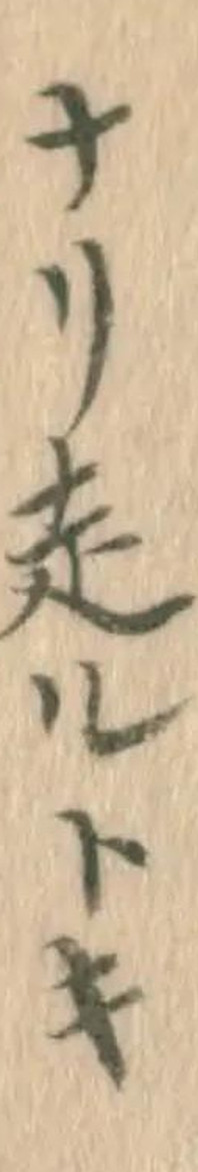ナリ走ルトキ
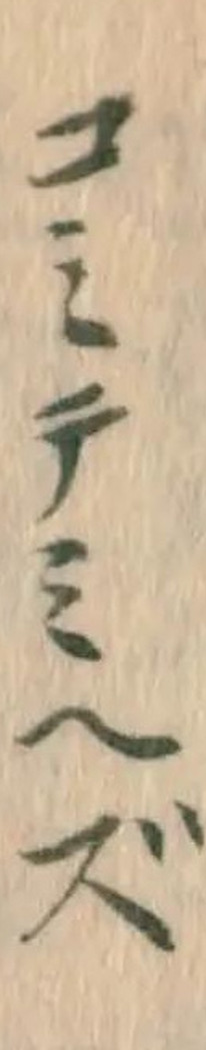コミテミヘズ
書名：千蟲譜 3巻. [2]
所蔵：国立国会図書館 National Diet Library, JAPAN
